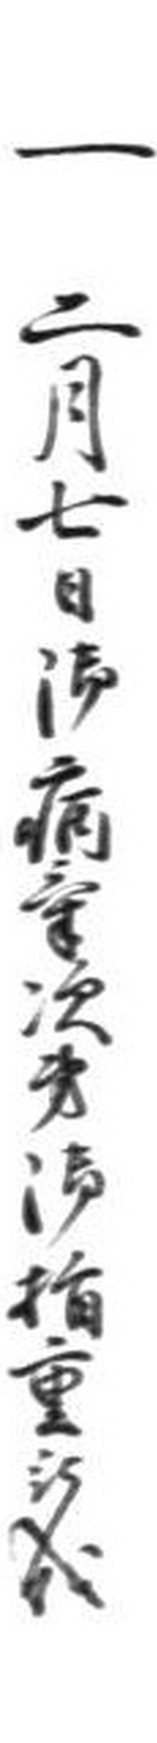一二月七日御病気次第御指重被成
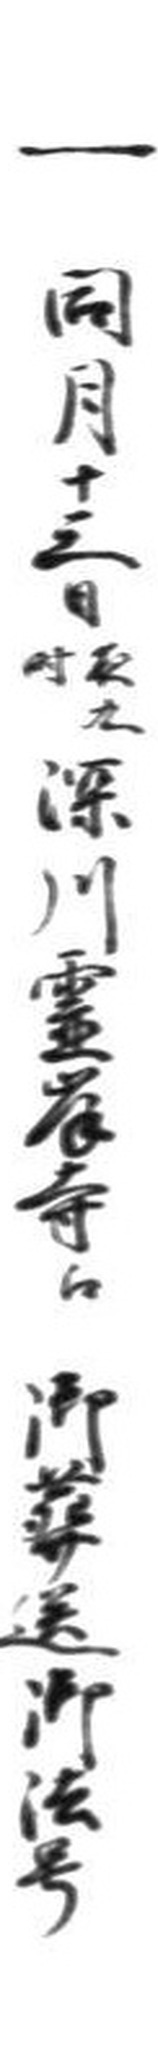一同月十三日夜九時深川霊岸寺江御葬送御法号

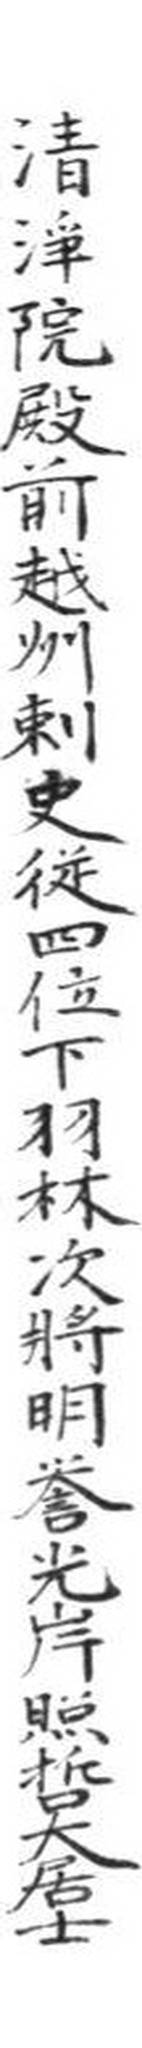清浄院殿前越州刺史従四位下羽林次将明誉光岸照哲大居士
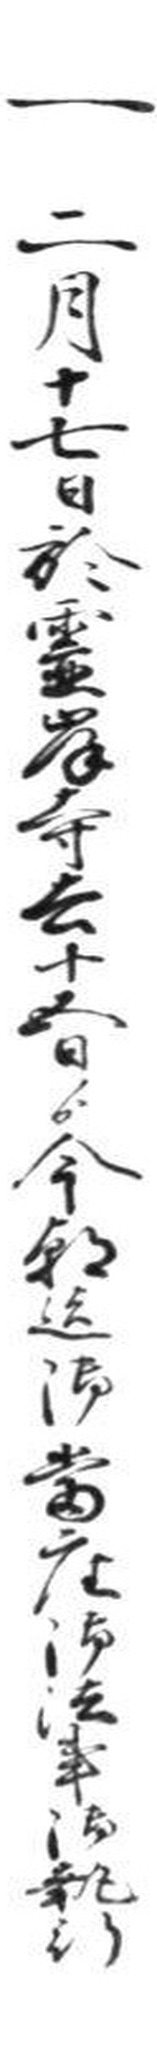一二月十七日於霊岸寺去十五日ゟ今朝迄御当座御法事御執行
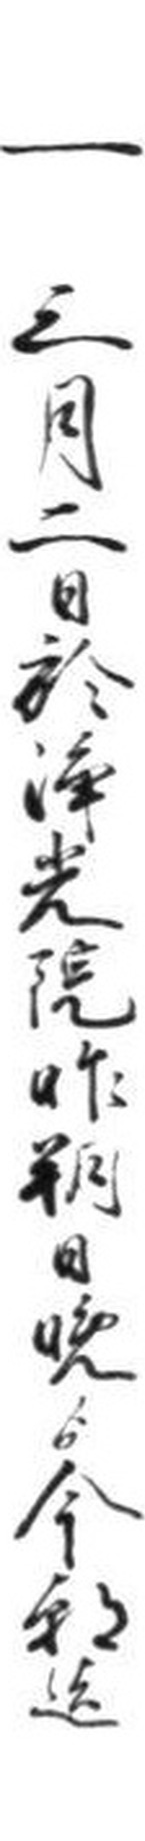一三月二日於浄光院昨朔日晩ゟ今朝迄
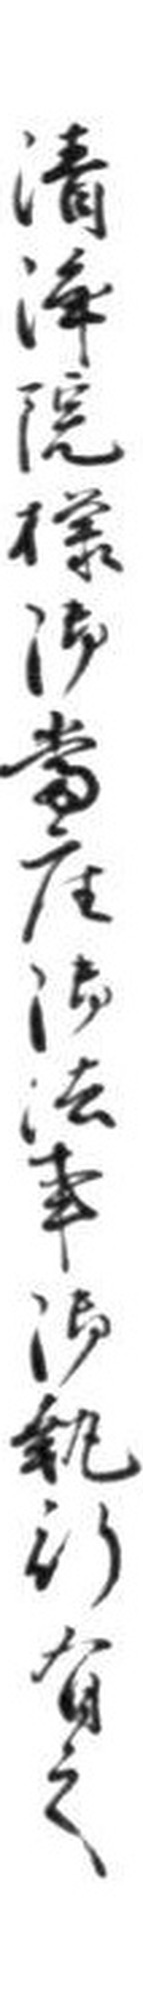清浄院様御当座御法事御執行有之
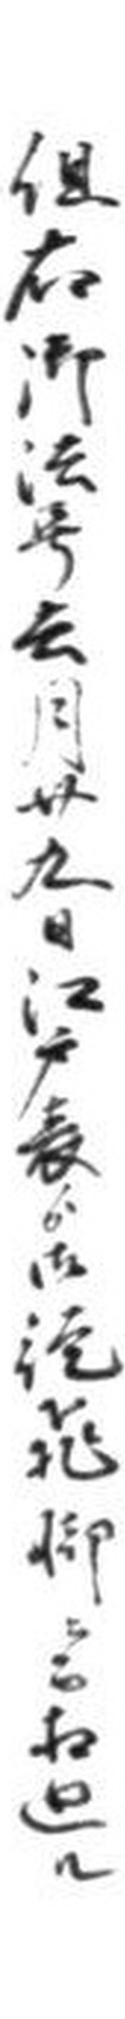但右御法号去月廿九日江戸表ゟ御徒飛脚ニ而相廻ル
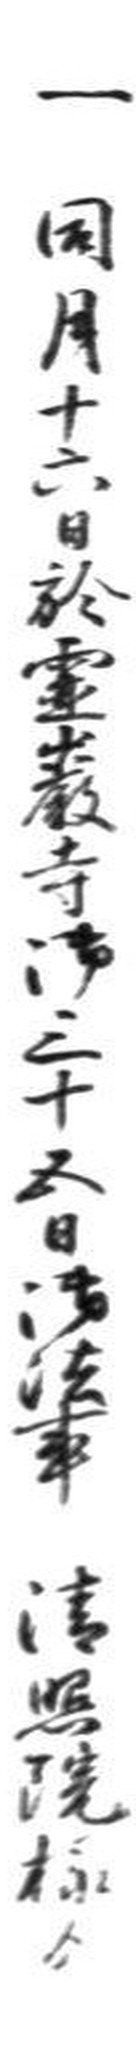一同月十六日於霊巌寺御三十五日御法事清照院様ゟ
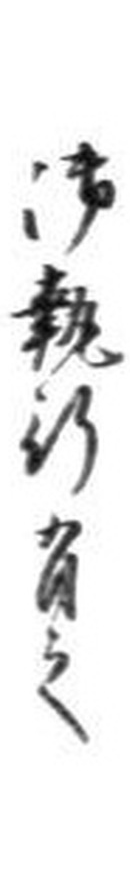御執行有之
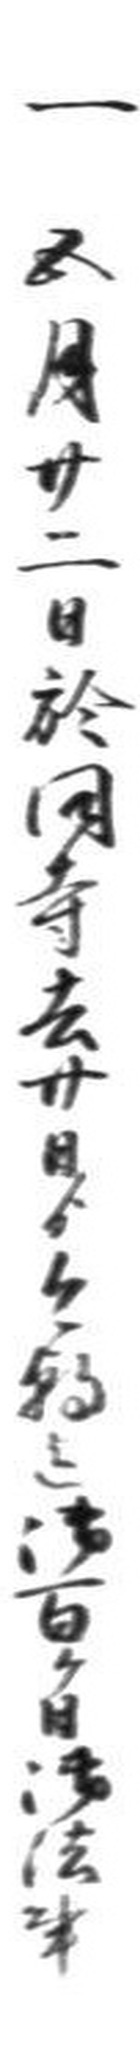一五月廿二日於同寺去廿日ゟ今朝迄御百ヶ日御法事
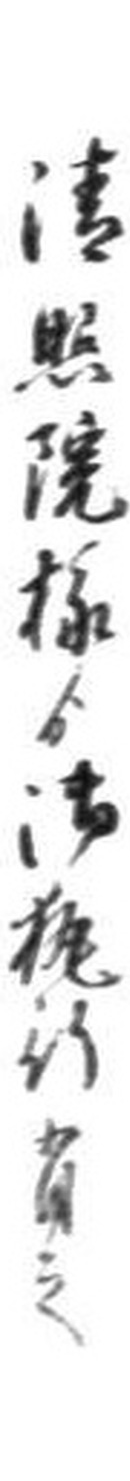清照院様ゟ御執行有之
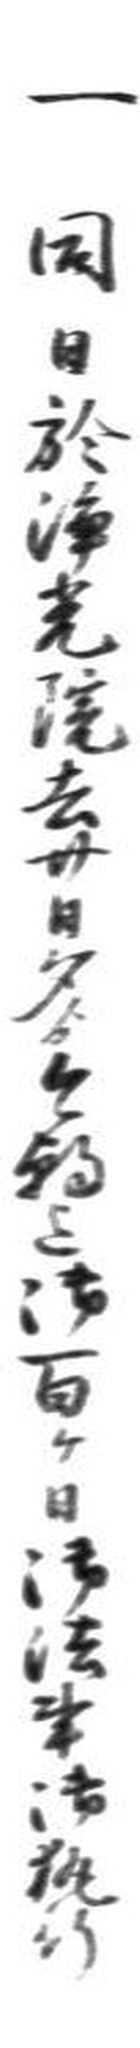一同日於浄光院去廿日夕ゟ今朝迄御百ヶ日御法事御執行

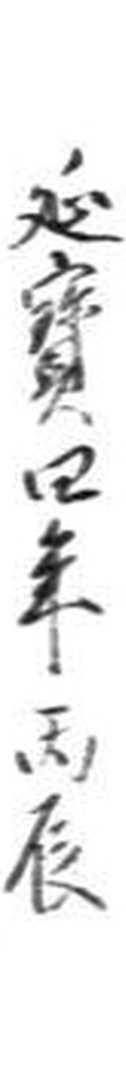延宝四年丙辰
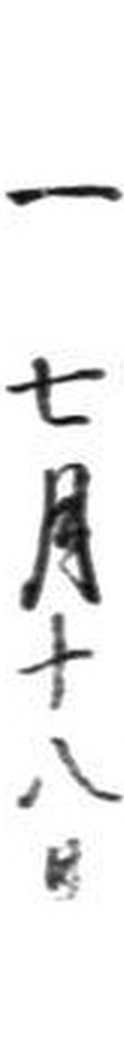一七月十八日
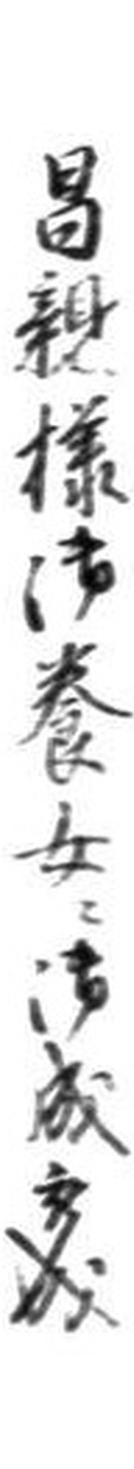昌親様御養女ニ御成被成
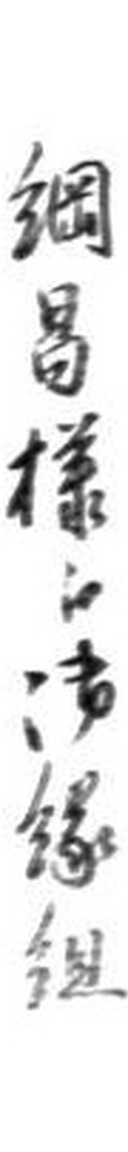綱昌様江御縁組
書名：家譜 十五 綱昌公 従天和元年到元禄十二年
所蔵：福井県文書館 Fukui Prefectural Archives
